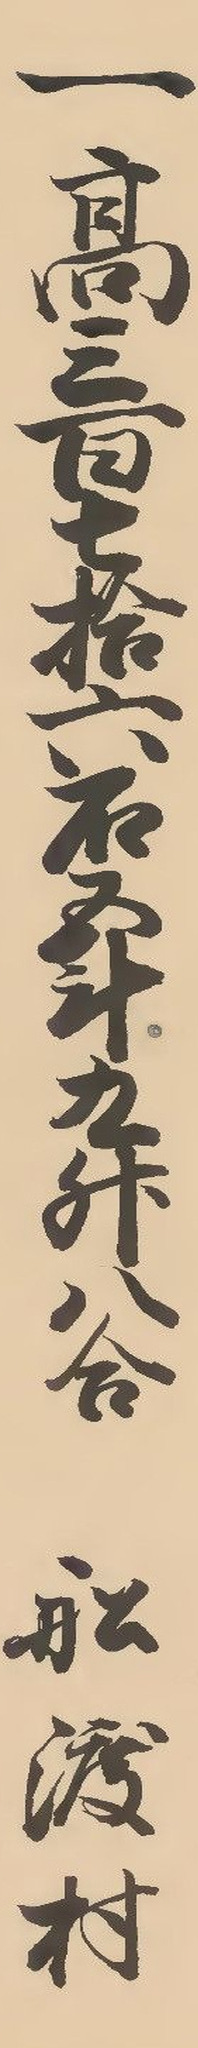一高三百七拾六石五斗九升八合船渡村
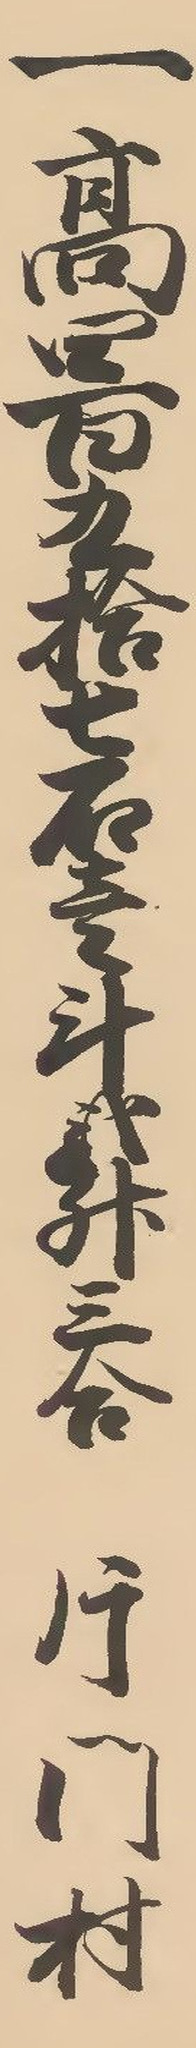一高四百九拾七石壱斗弐升三合片門村
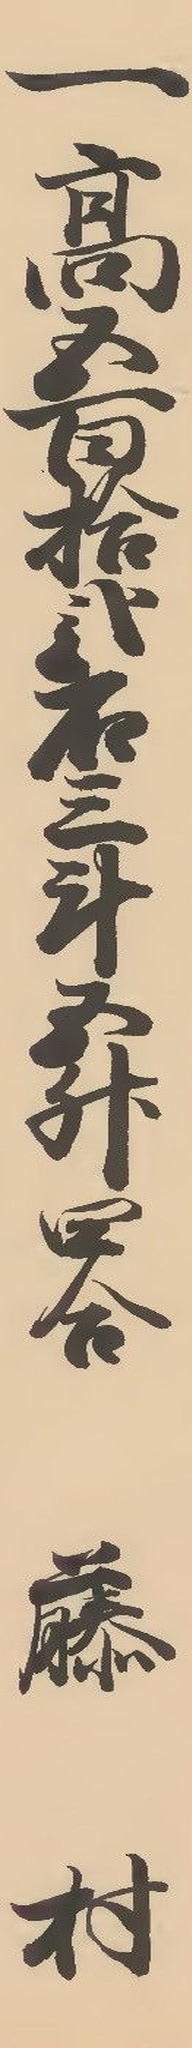一高五百拾弐石三斗五升四合藤村
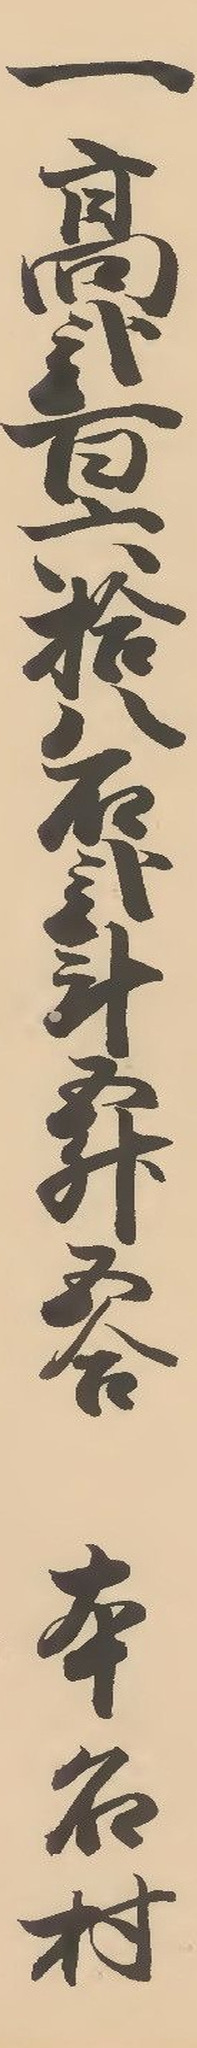一高弐百六拾八石弐斗五升五合本名村
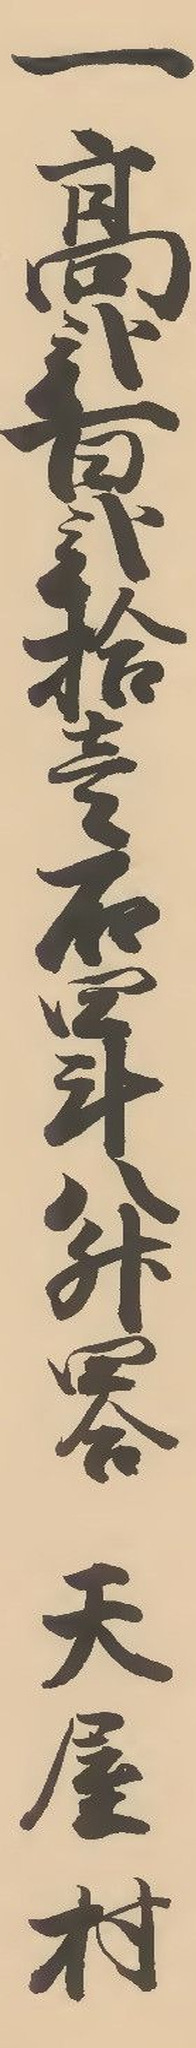一高弐百弐拾壱石四斗八升四合天屋村
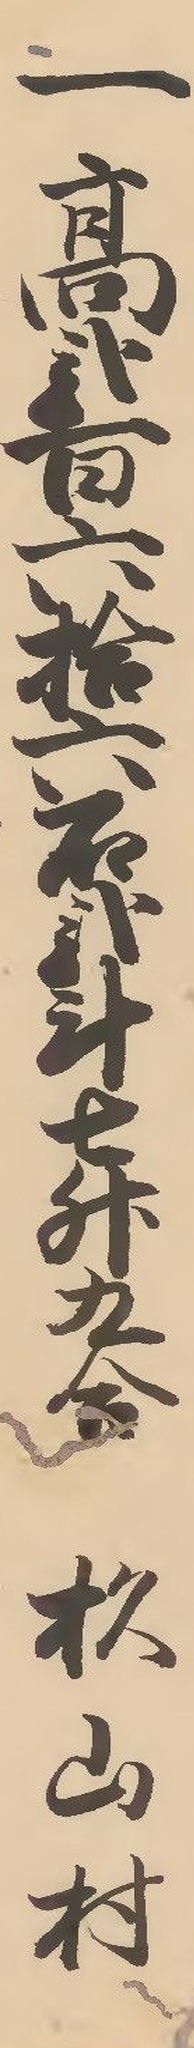一高弐百六拾六石弐斗七升九合杉山村

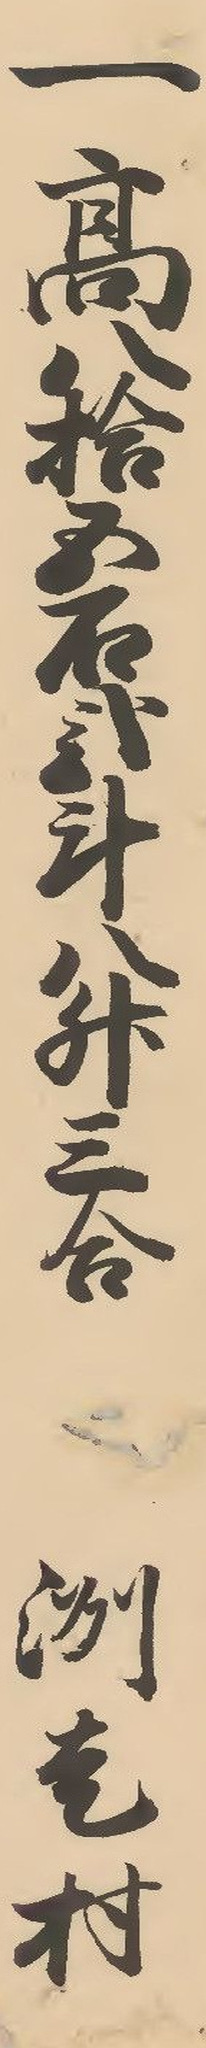一高八拾五石弐斗八升三合洲走村
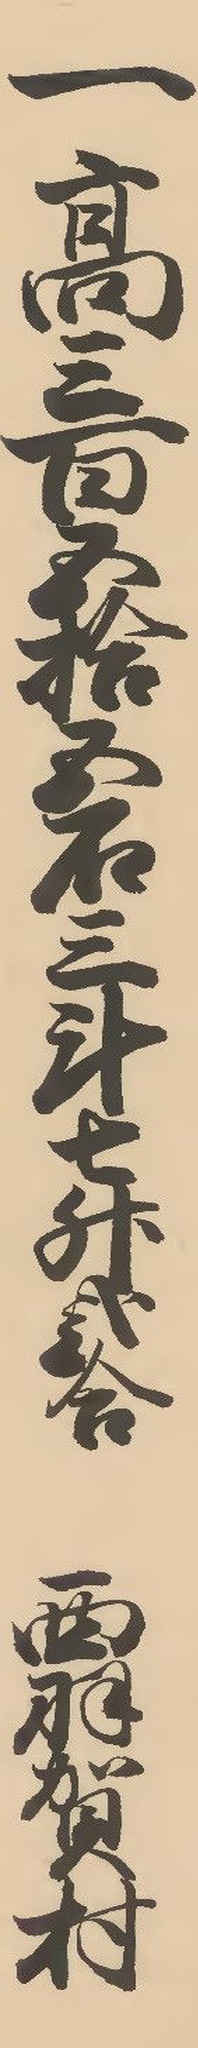一高三百五拾五石三斗七升弐合西羽賀村
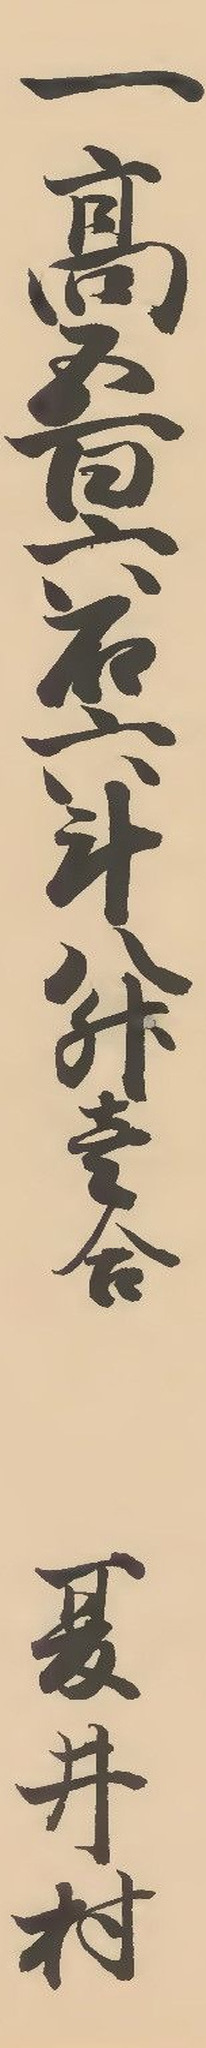一高五百六石六斗八升壱合夏井村
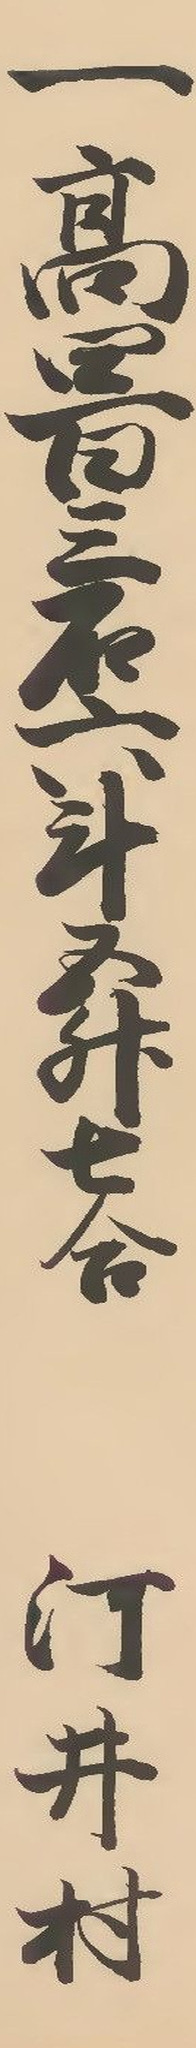一高四百三石六斗五升七合河井村
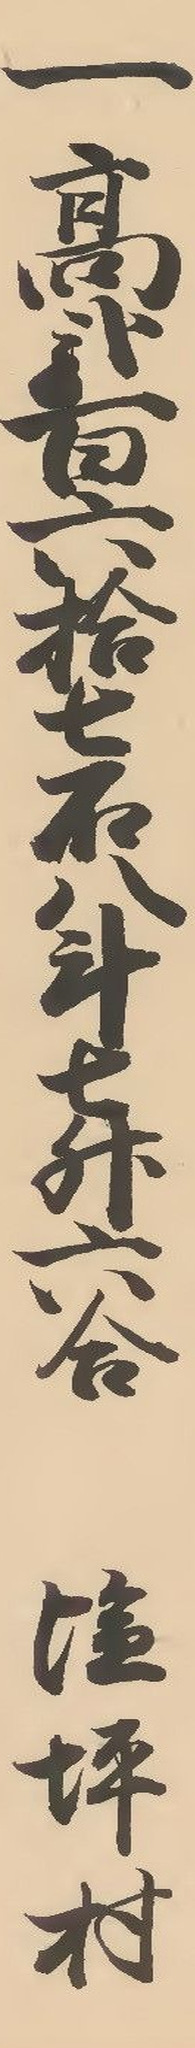一高弐百六拾七石八斗七升六合塩坪村
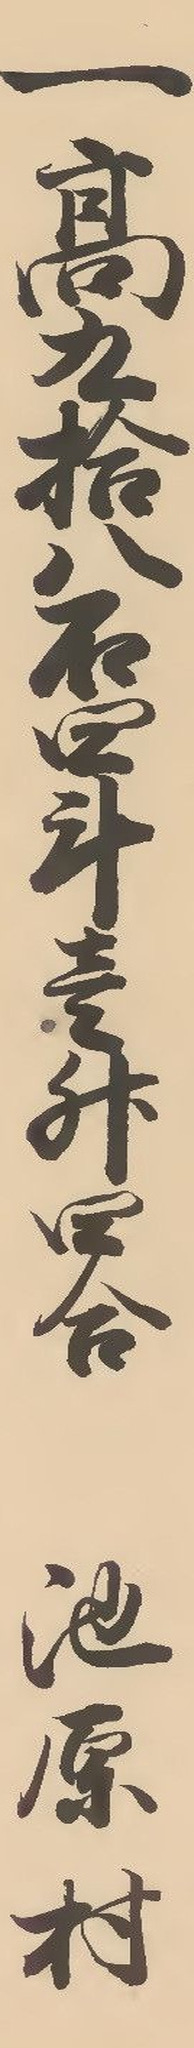一高九拾八石四斗壱升四合池原村
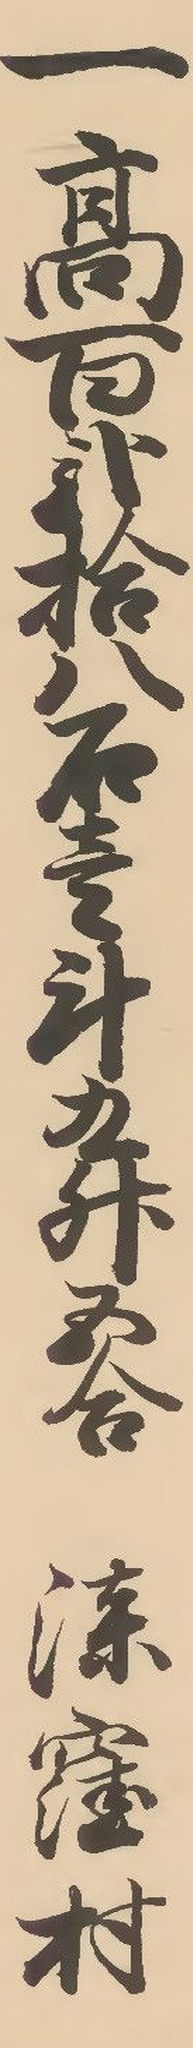一高百弐拾八石壱斗九升五合漆窪村
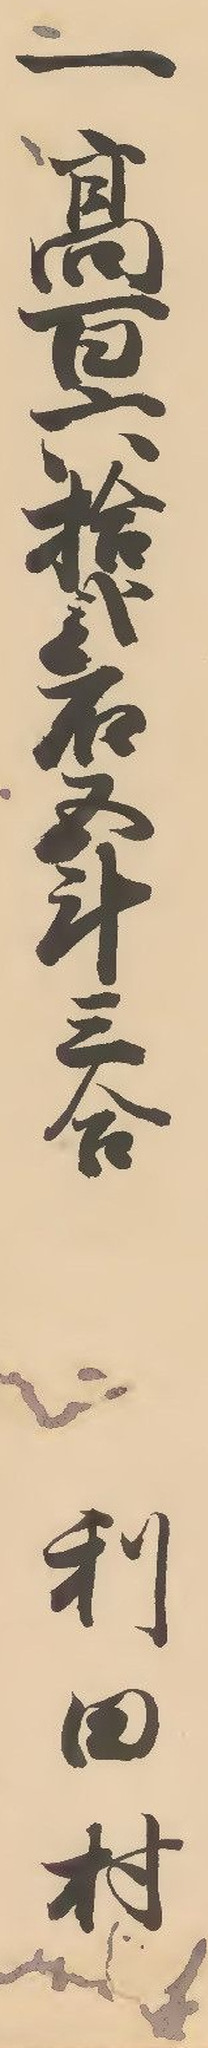一高百六拾弐石五斗三合利田村

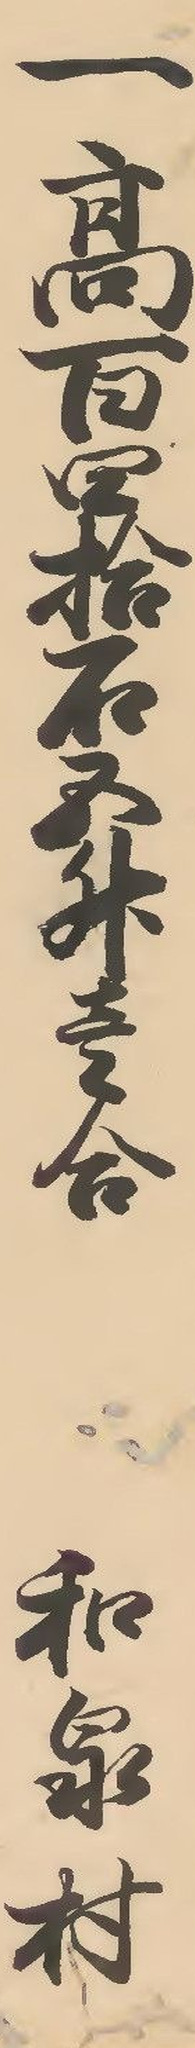一高百四拾石五升壱合和泉村
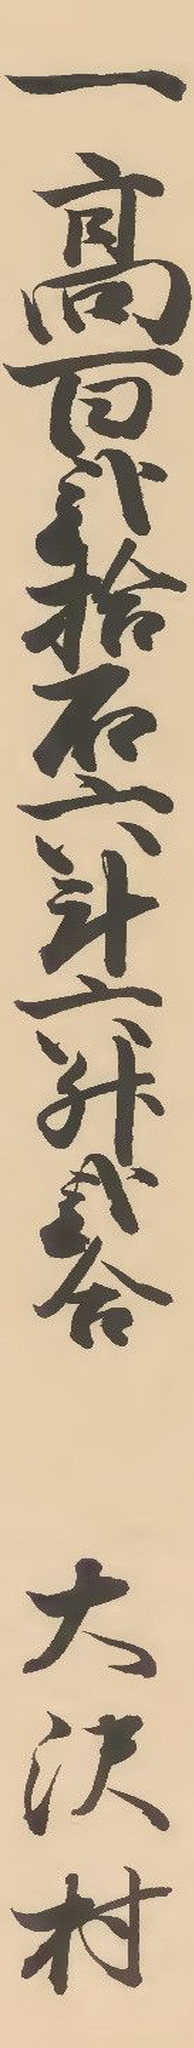一高百弐拾石六斗六升弐合大沢村
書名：陸奥国郷帳　１
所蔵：国立公文書館 National Archives of Japan
